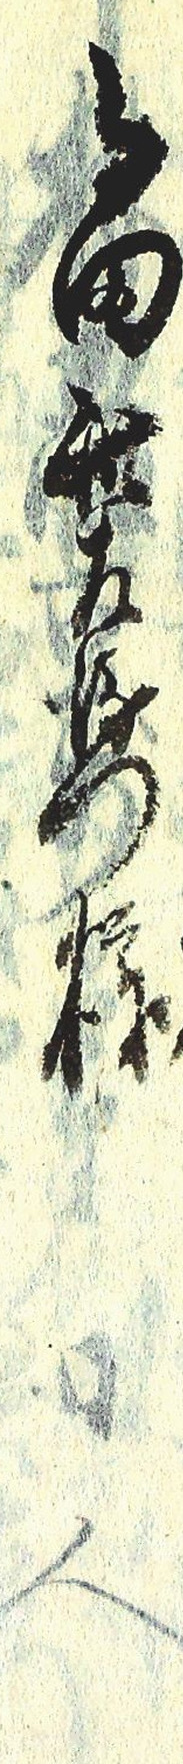高田此左衛門様
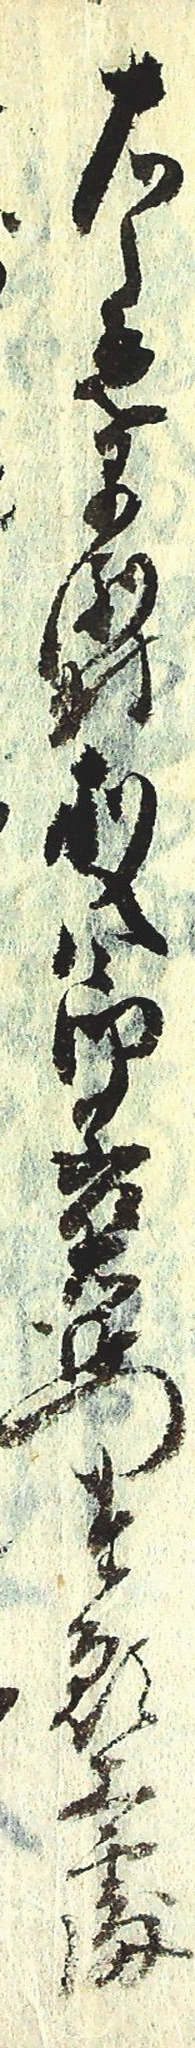右之通早淵村利八郎善右衛門奉願上処
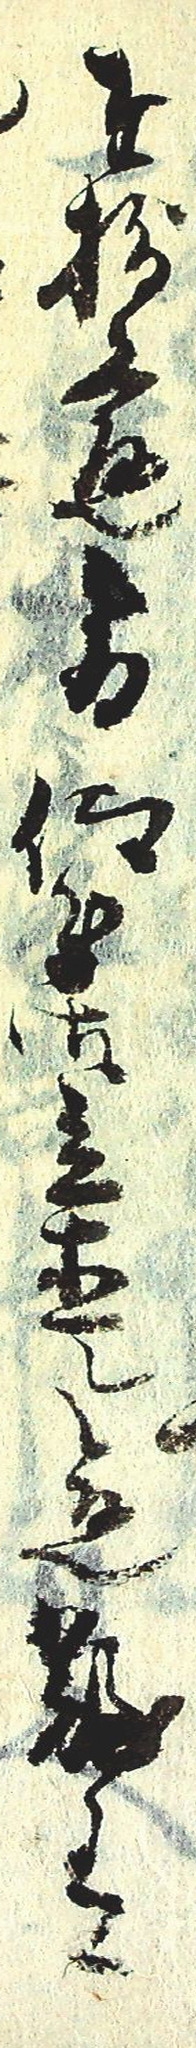奉指上通被為仰付御立直し之通難有
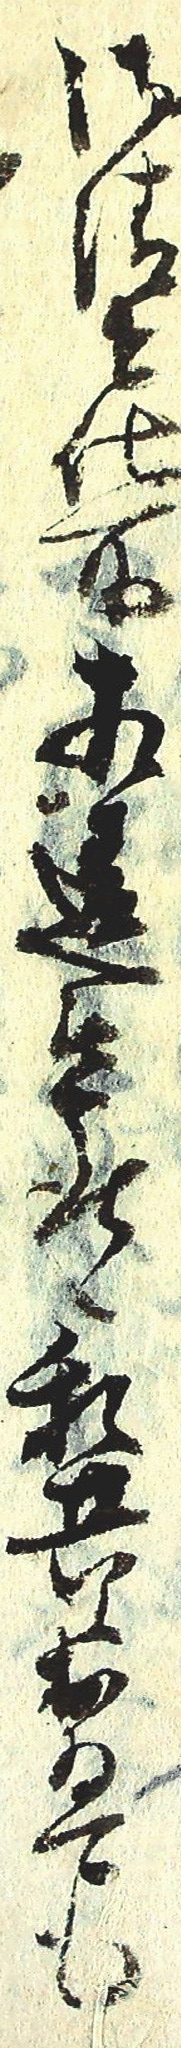御請書仕所相違無御座候私共におゐても
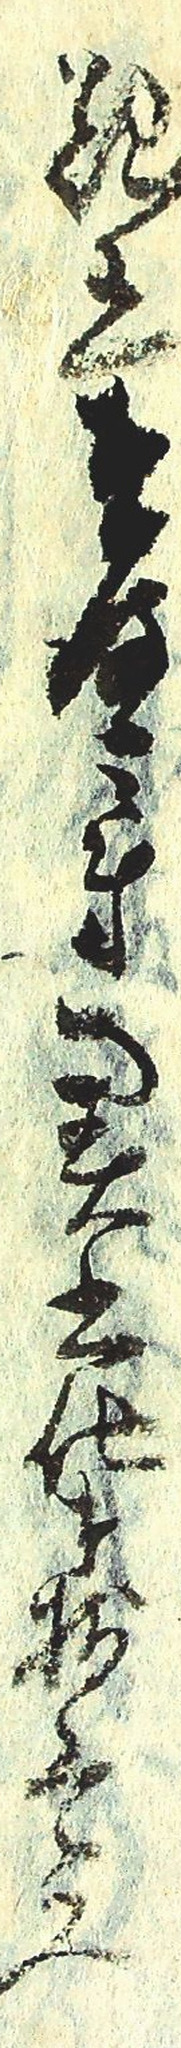難有奉存候に付奥書仕奉指上候以上
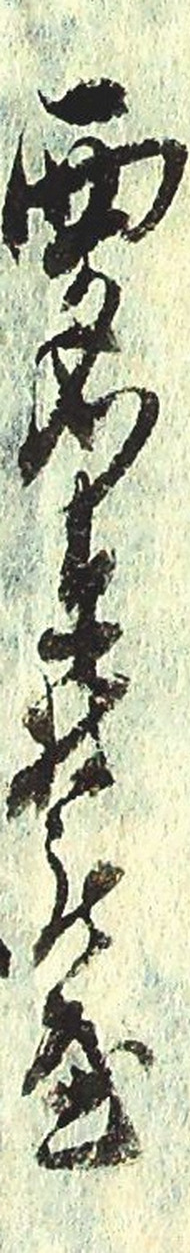西名東村庄屋
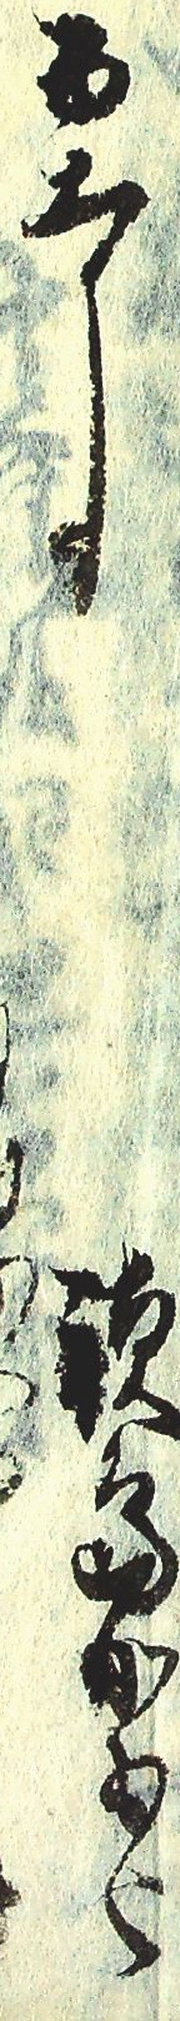酉十一月禎島加五郎
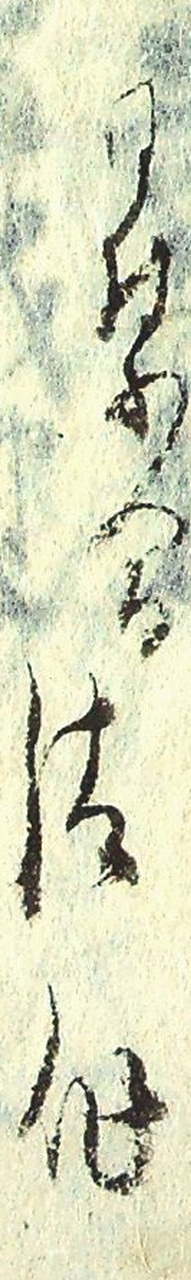同村五人与
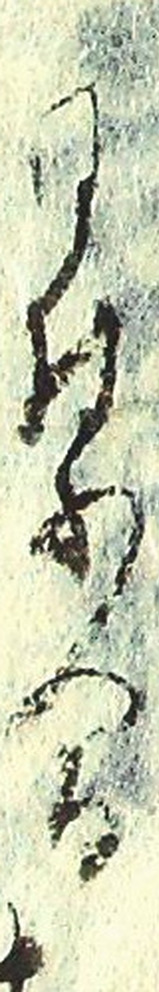同村五人与
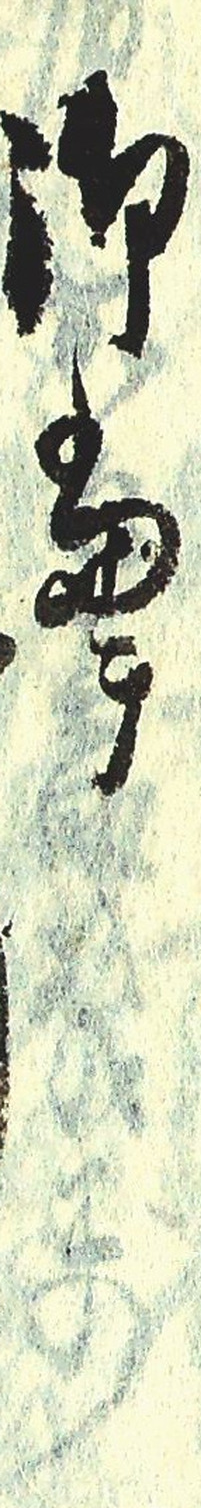御当て
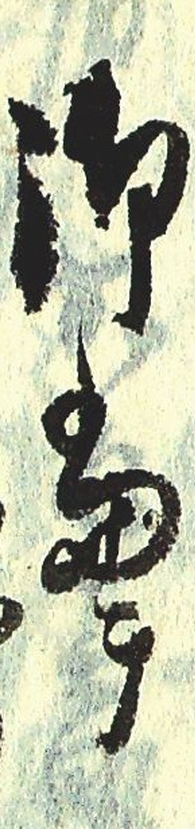御当て
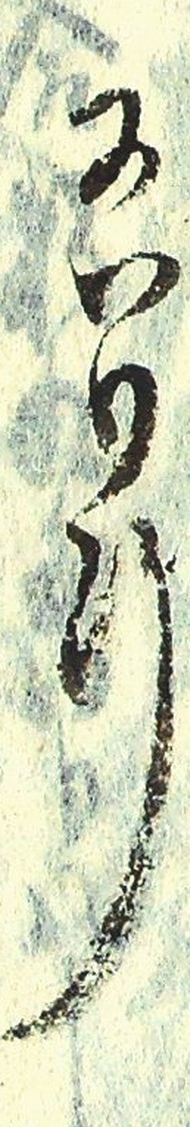右同断

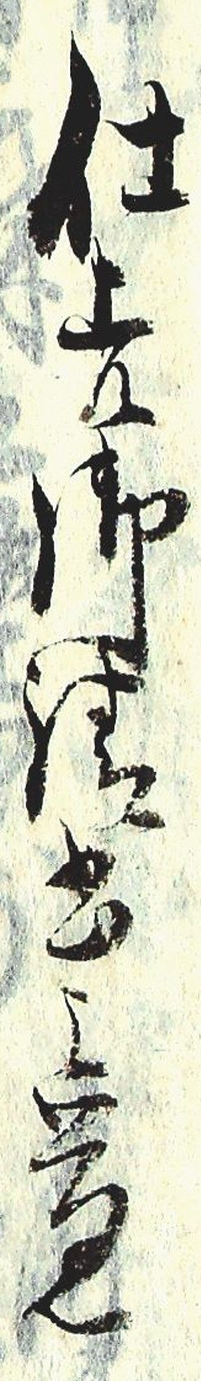仕上る御請書之覚
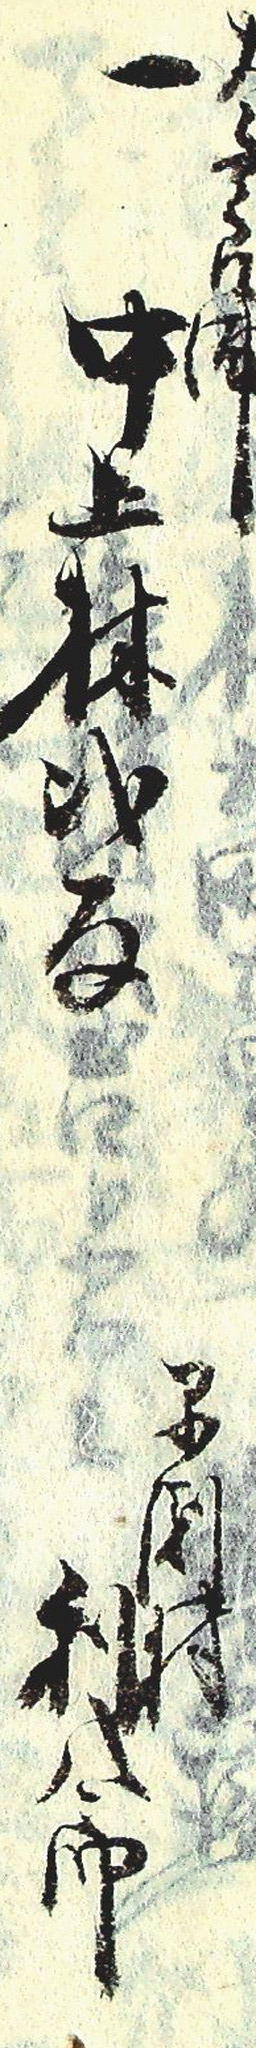一中上林弐反利八郎
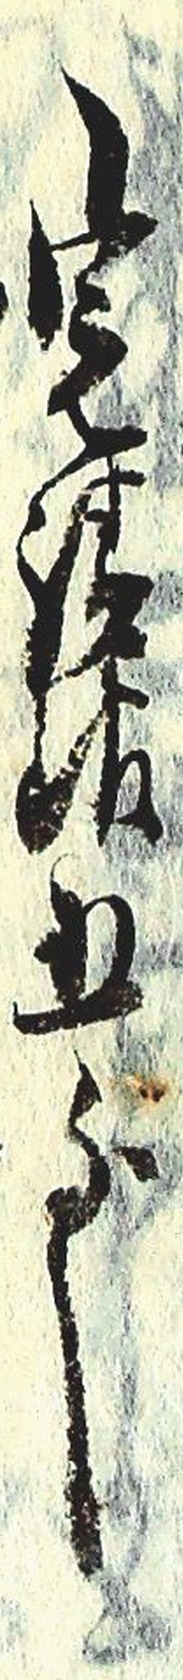定請銀五匁
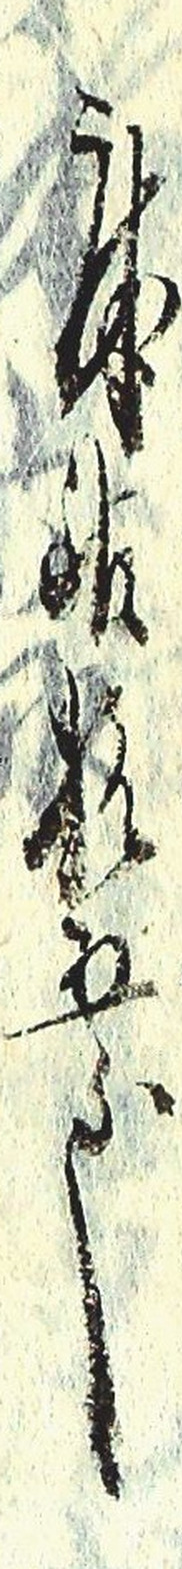床銀拾五匁
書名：諸御願書控(弐番）
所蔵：鳴門教育大学 Naruto University of Education
